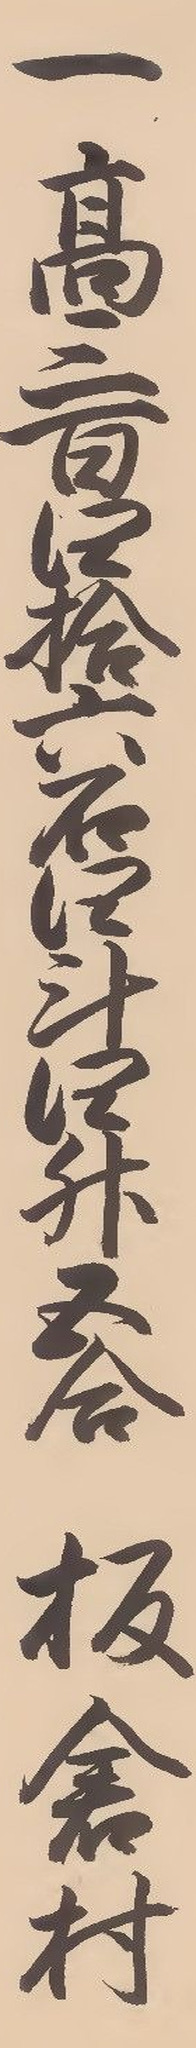一高三百四拾六石四斗四升五合板倉村
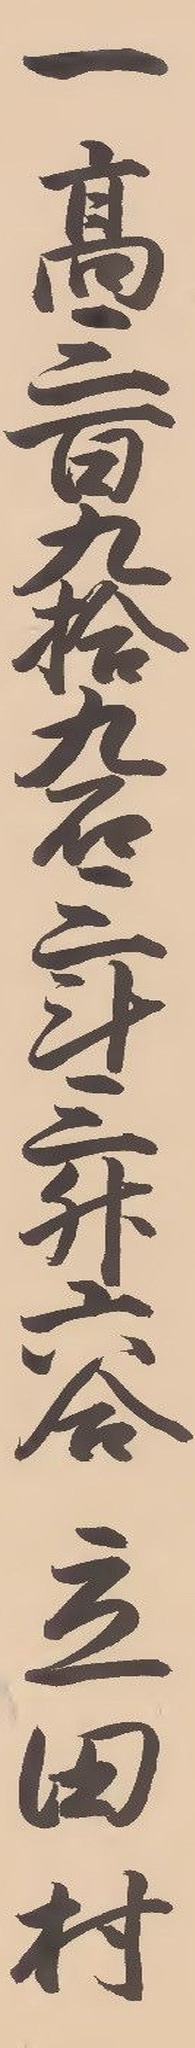一高三百九拾九石三斗三升六合立田村
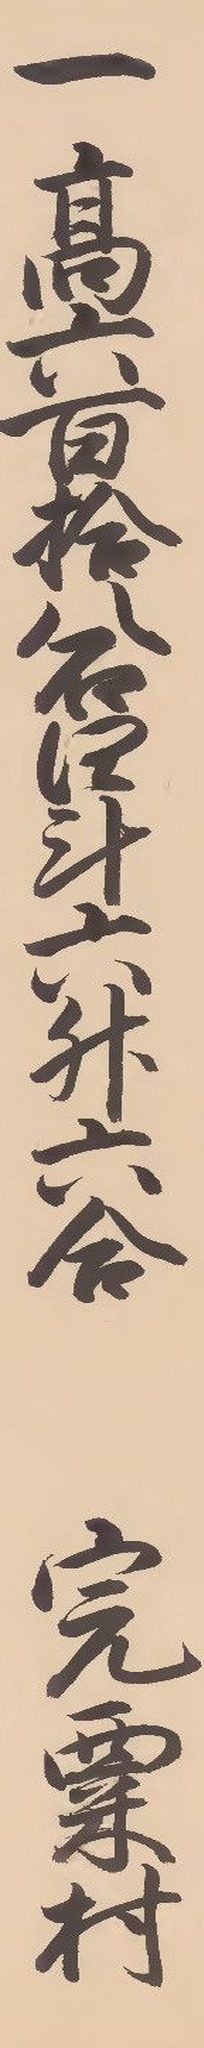一高六百拾八石四斗六升六合完粟村
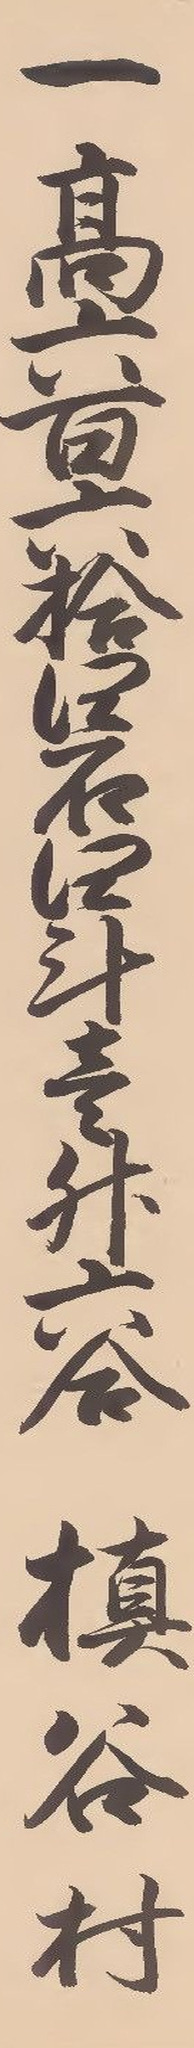一高六百六拾四石四斗壱升六合槙谷村
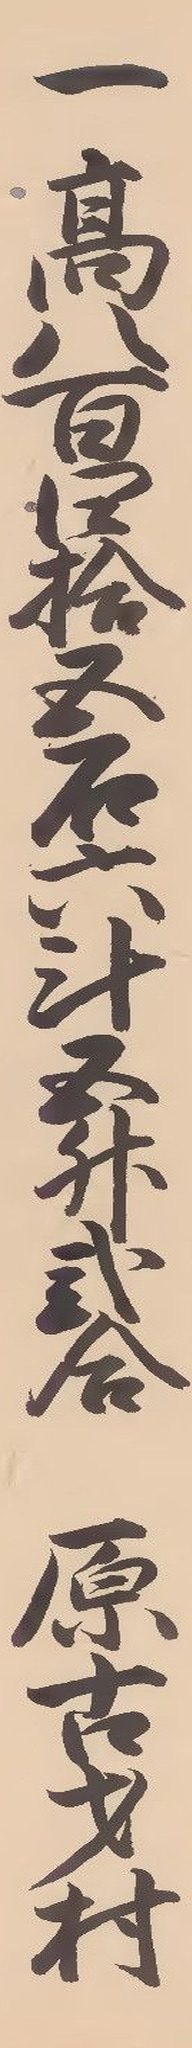一高八百四拾五石六斗五升弐合原古才村

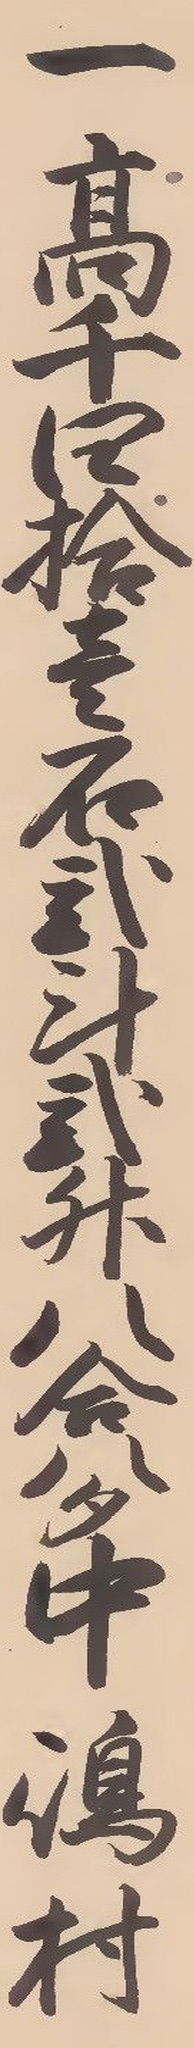一高千四拾壱石弐斗弐升八合八勺中島村
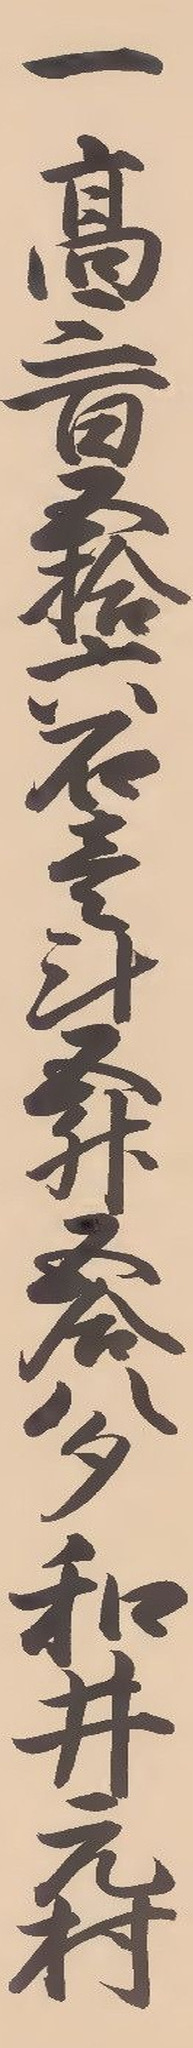一高三百五拾六石壱斗五升五合八勺和井元村
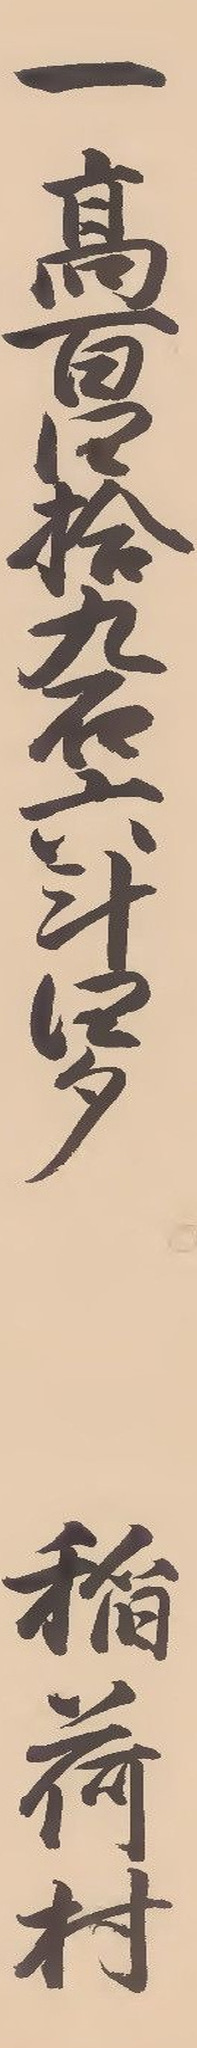一高百四拾九石六斗四勺稲荷村
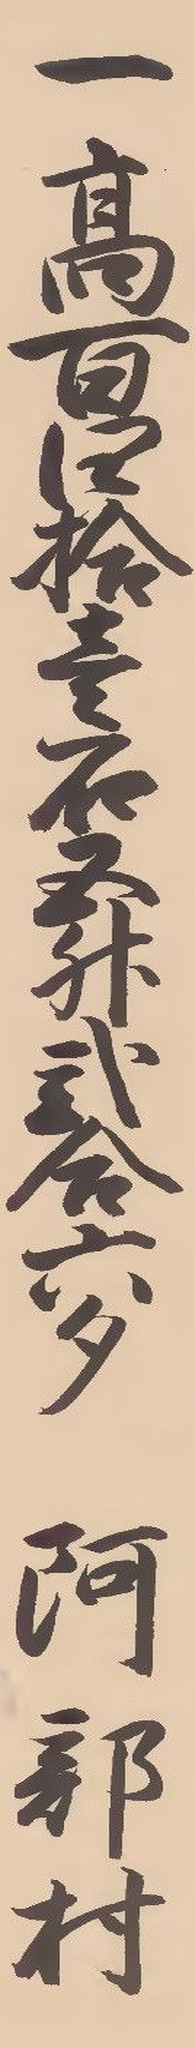一高百四拾壱石五升弐合六勺阿部村
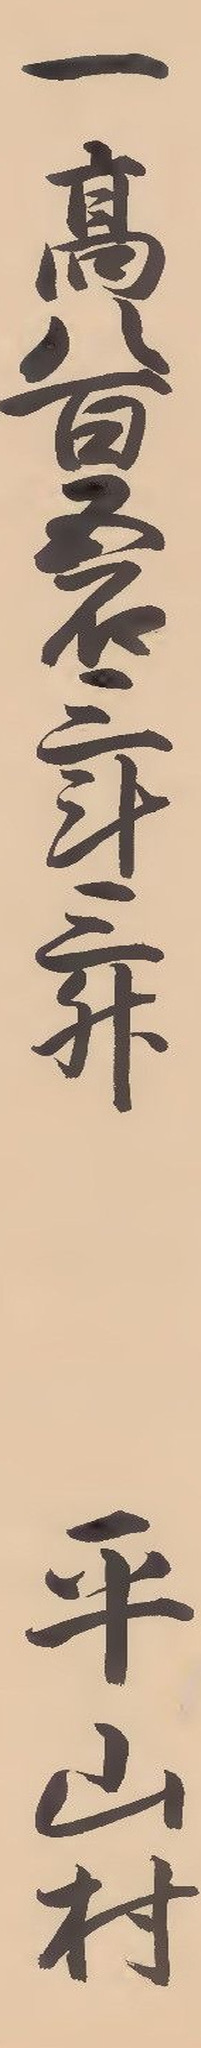一高八百五石三斗三升平山村
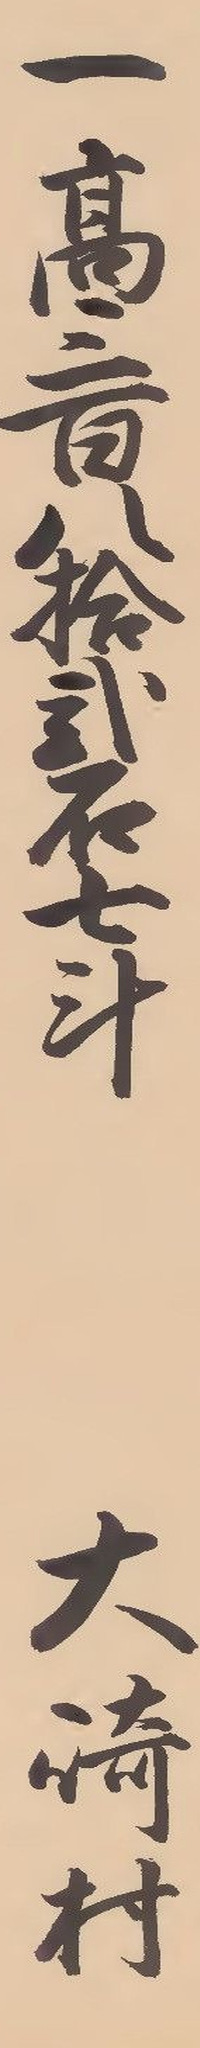一高三百八拾弐石七斗大崎村
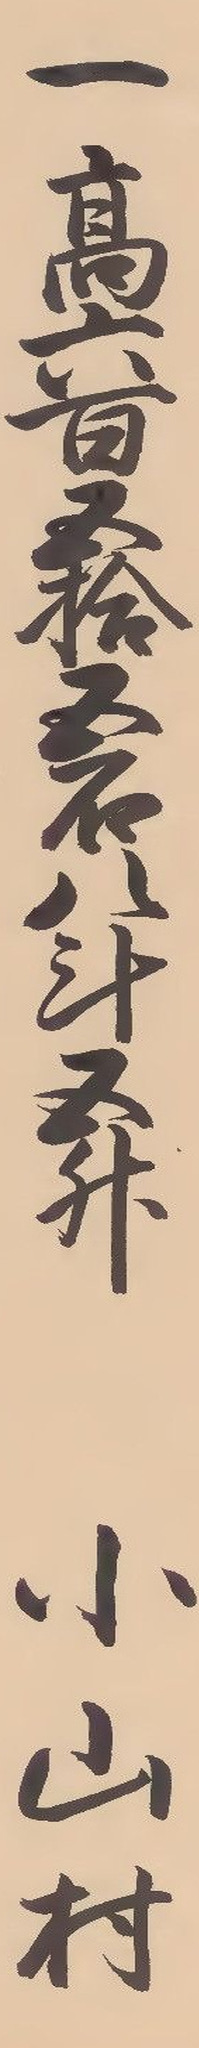一高六百五拾五石八斗五升小山村
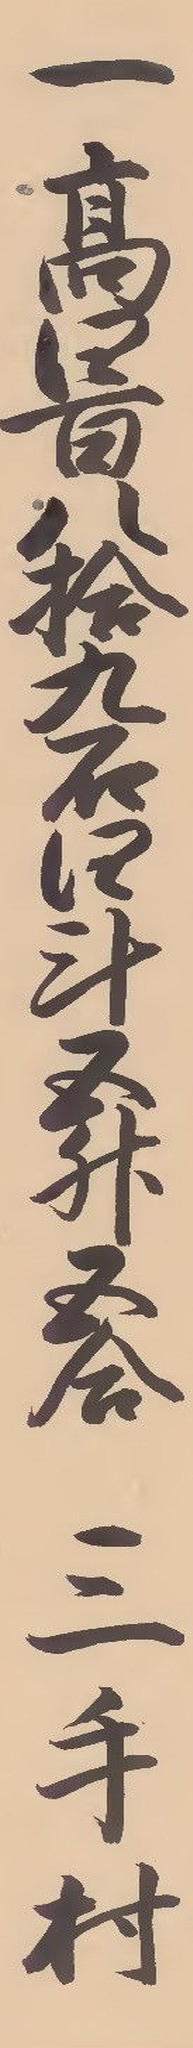一高四百八拾九石四斗五升五合三手村

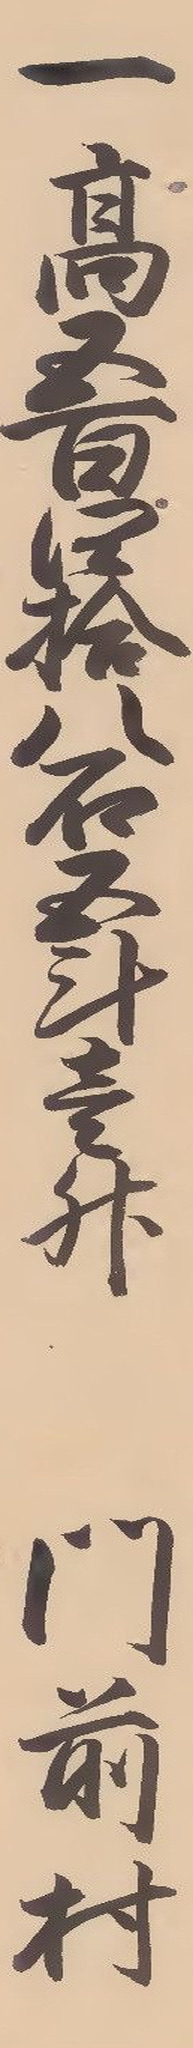一高五百四拾八石五斗壱升門前村
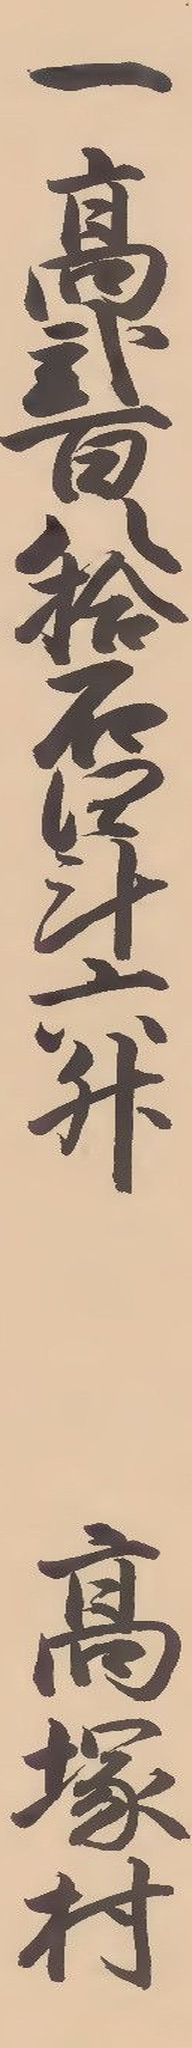一高弐百八拾石四斗六升高塚村
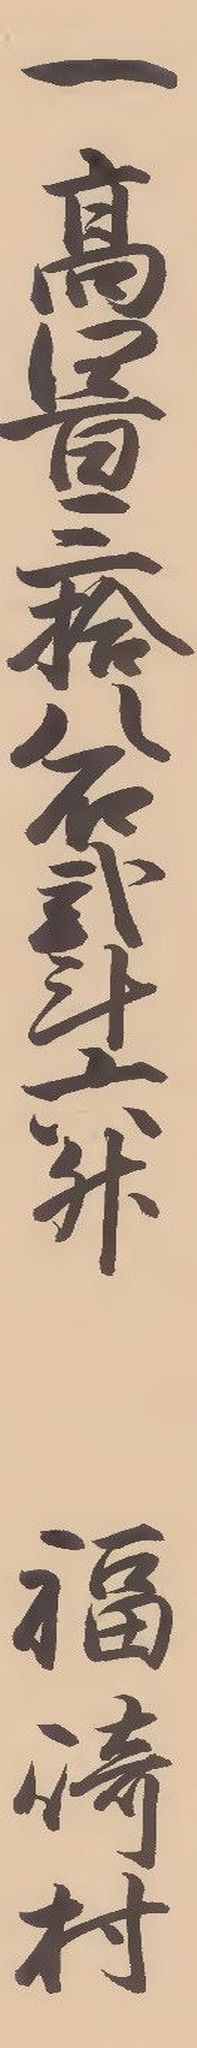一高四百三拾八石弐斗六升福崎村
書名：備中国郷帳
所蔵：国立公文書館 National Archives of Japan
